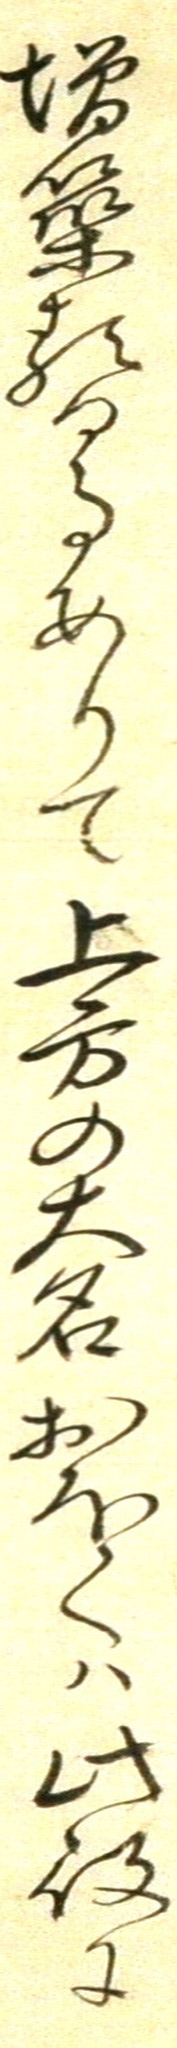増築類日高ありありて上方の大名おほくは此役に
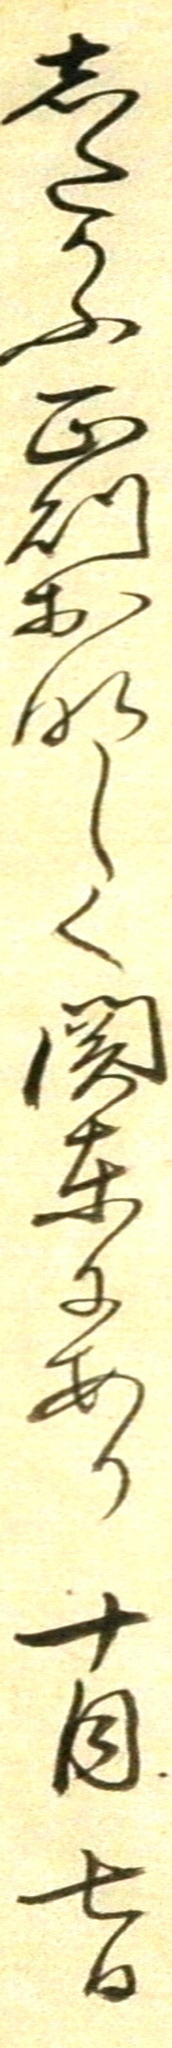したかふ正則おなしく関東にあり十月七日
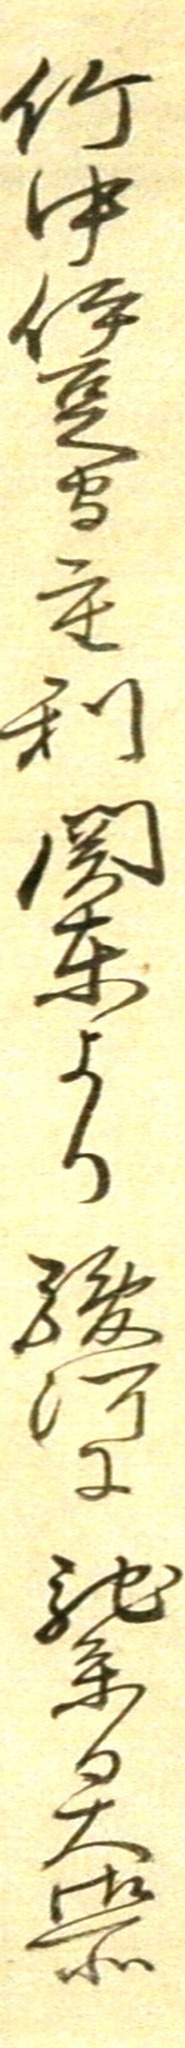竹中伊豆守重利関東より駿河に馳参る大御所
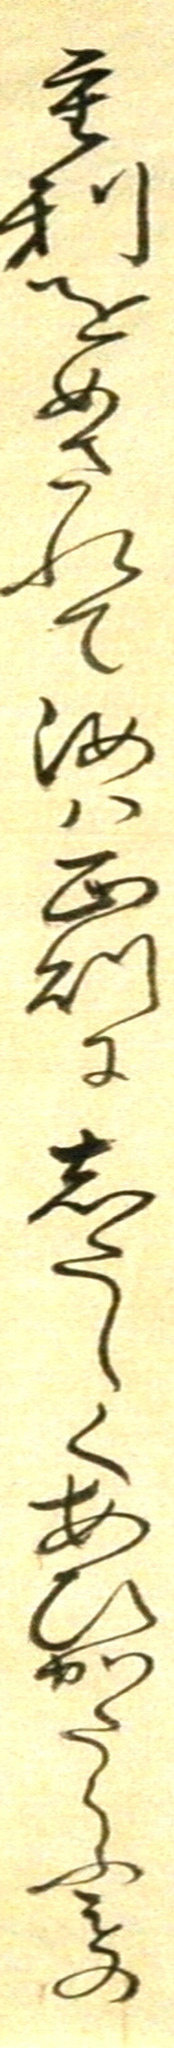重利をめされて汝は正則にしたしくあひかたくふもの
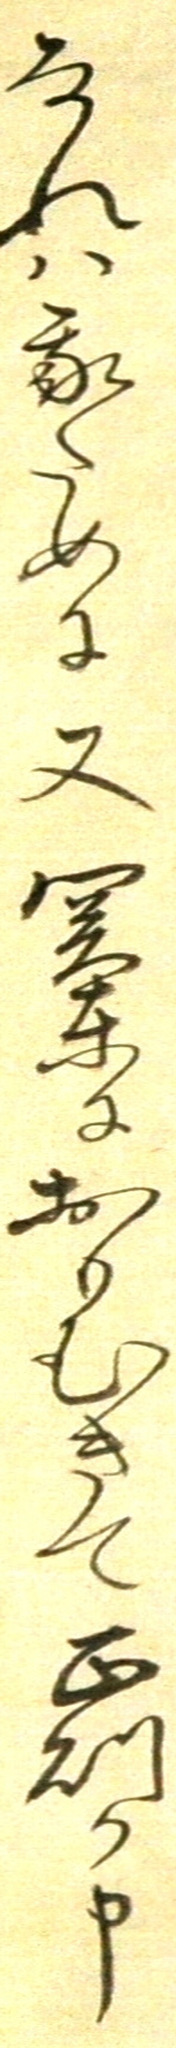なれは我ために又関東におもむきて正則か申
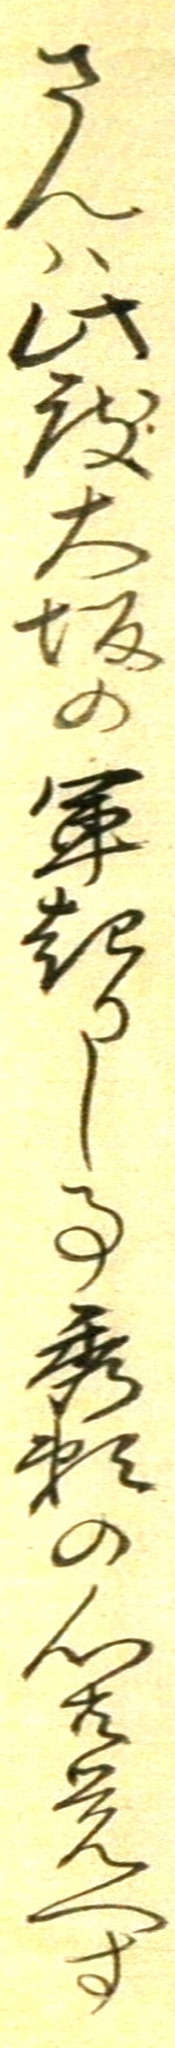さんは此度大坂の軍起りし事秀頼の心共覚へす

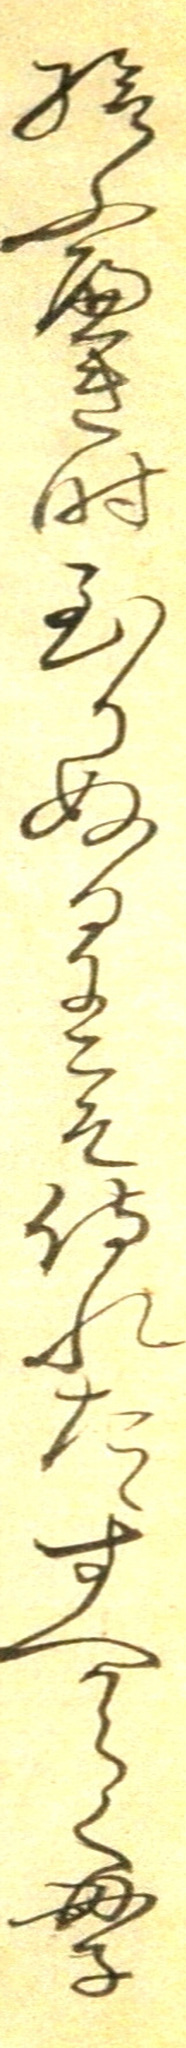給ふへき時至りぬるにこそ侍れたゝすへからく母子
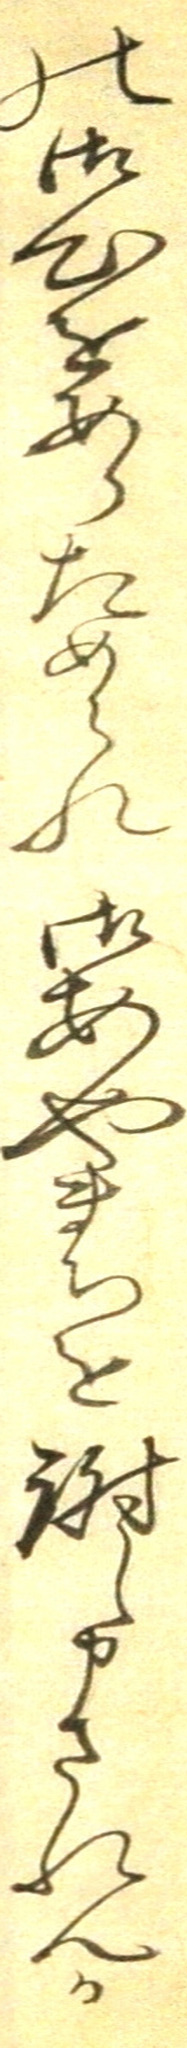の御心をあらためられ御あやまちを謝し申されんか
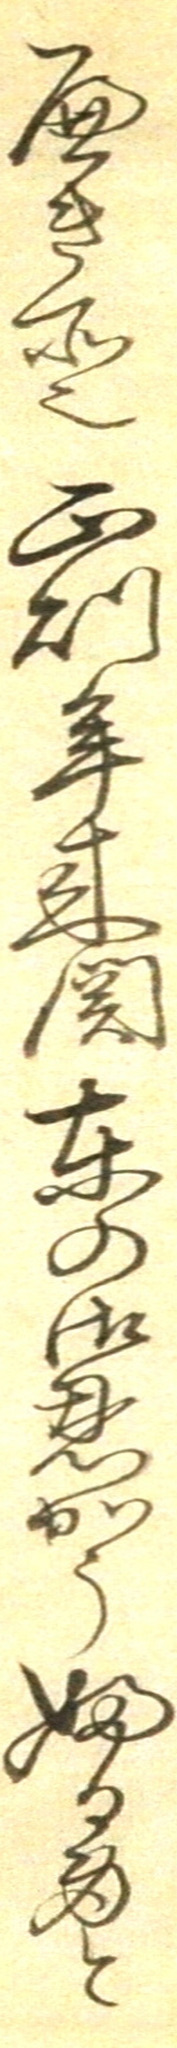へき所也正則年来関東の御忍かうふる身と
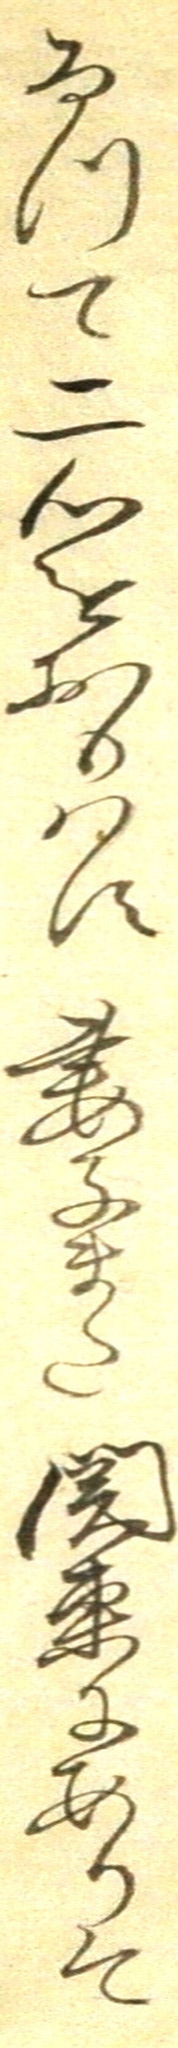なつて二心をおもはす妻子また関東にありて
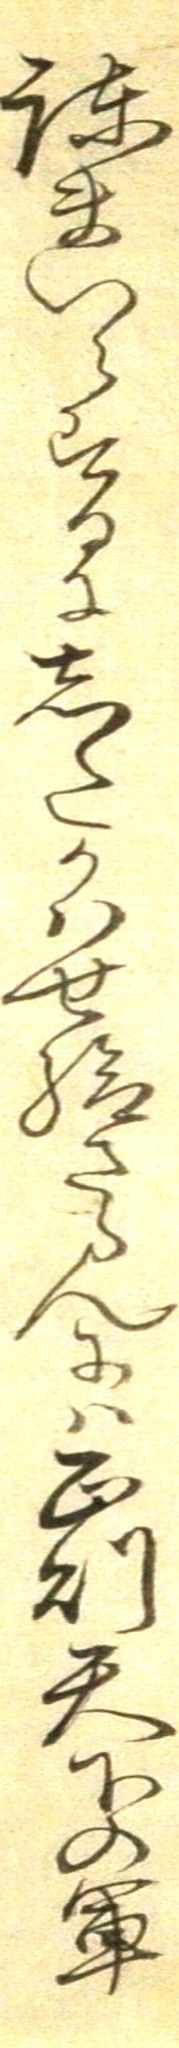陣まいらするにしたかはせ給さらんには正則天下の軍
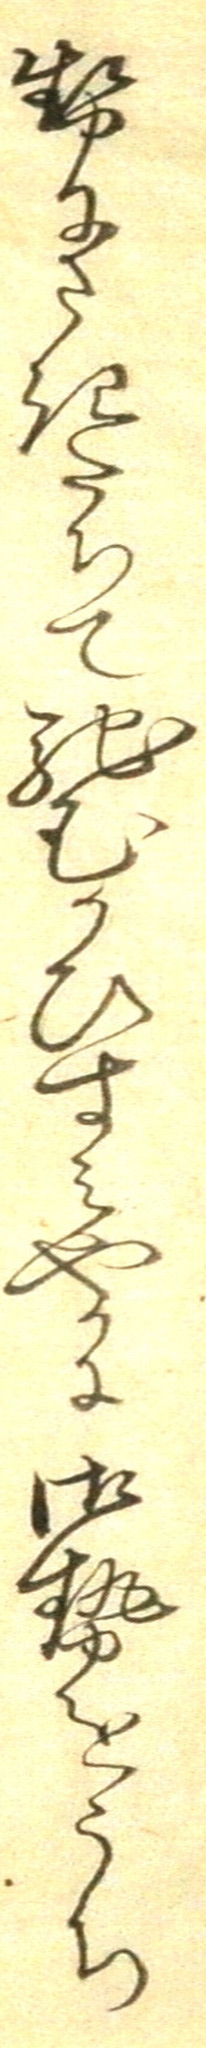勢にたきたちて馳むかひすみやかに御勢をうち
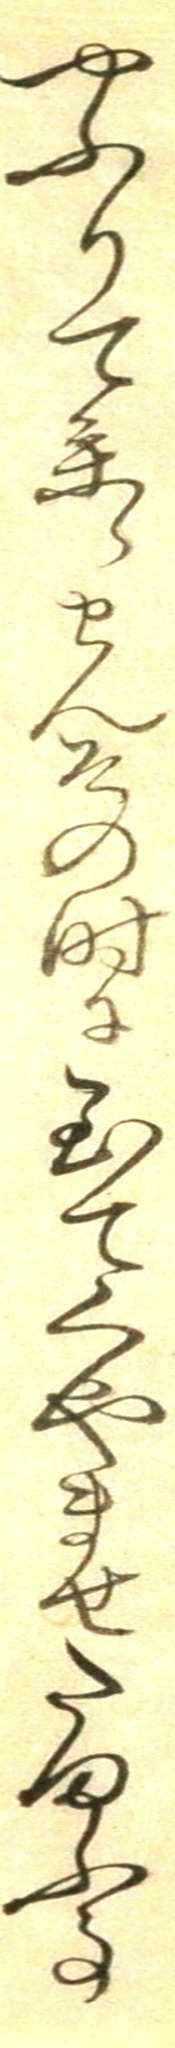やふりて参らせんその時に至てくやませたまふ事
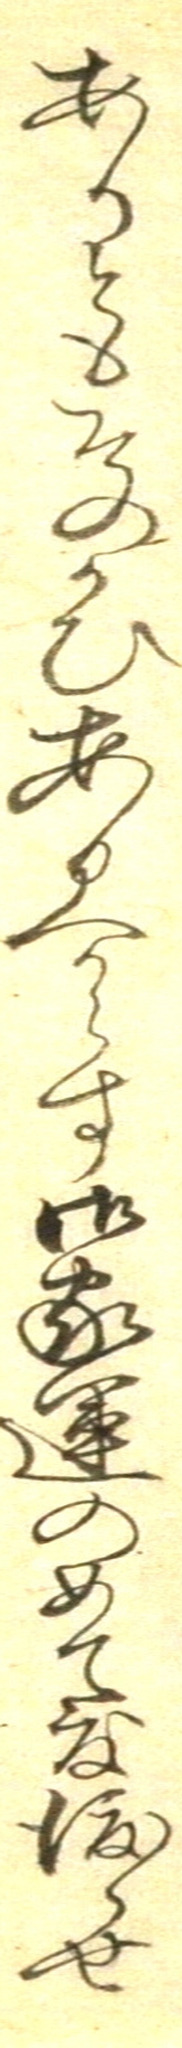ありともそのかひあるはからす御家運のめて度渡らせ
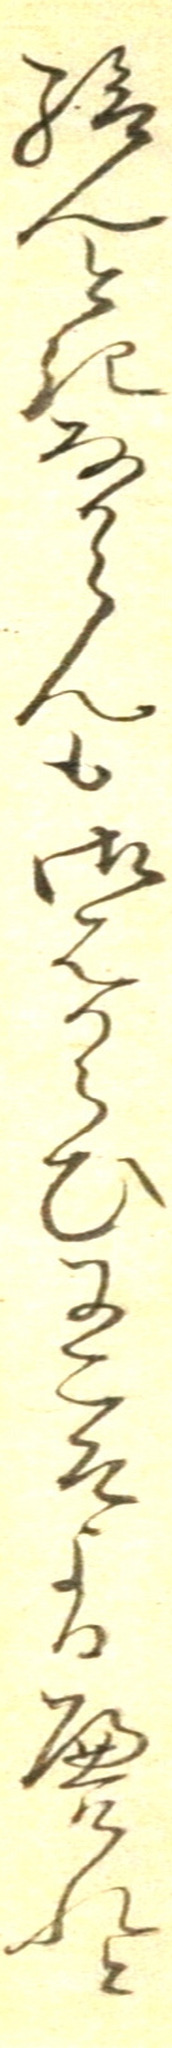給んときなからんも御はからひにこそよるへけれと
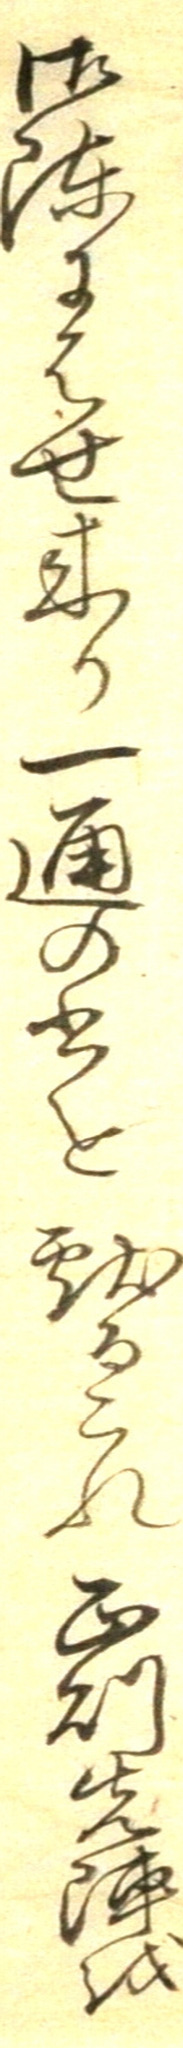御陣にはせ来り一通の書を献るこれ正則先陣を
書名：藩翰譜（十二・上）
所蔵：伊那市立高遠町図書館・合同会社AMANE
